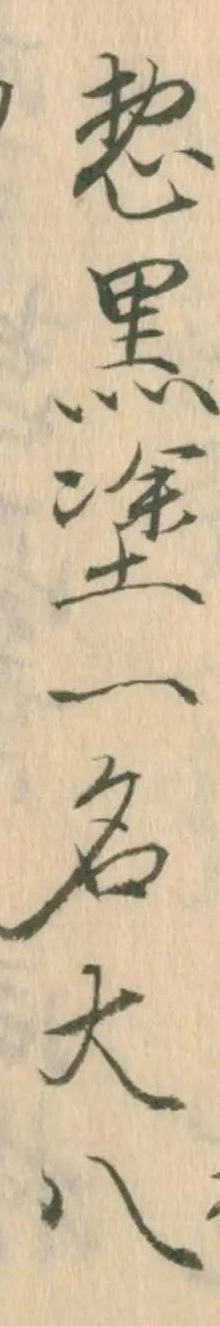惣黒塗一名大八
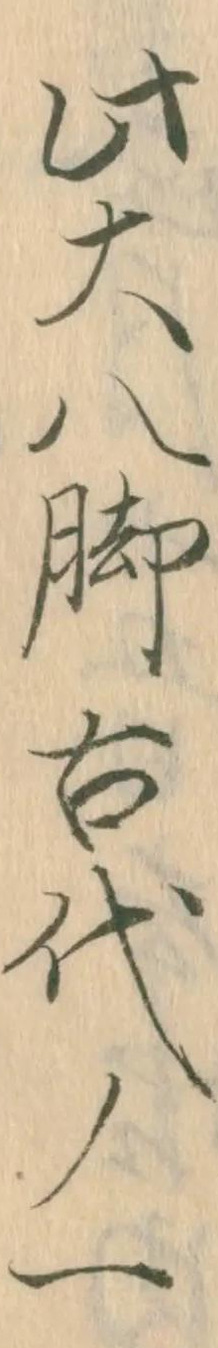此大八脚古代ノ一
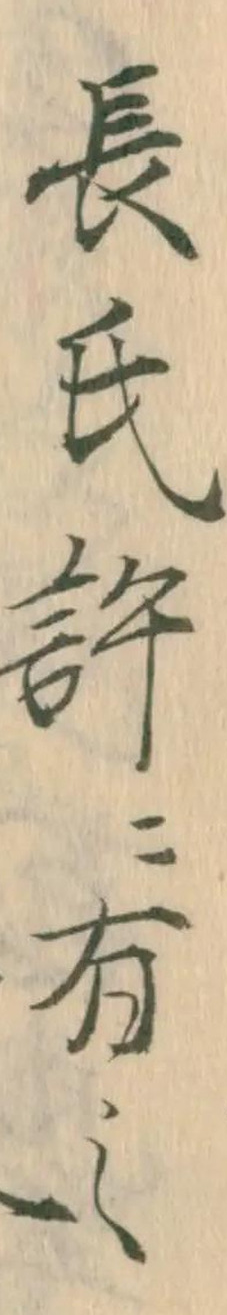長氏許ニ有之
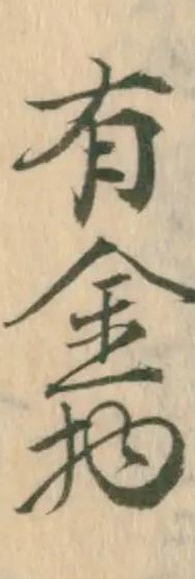有金物
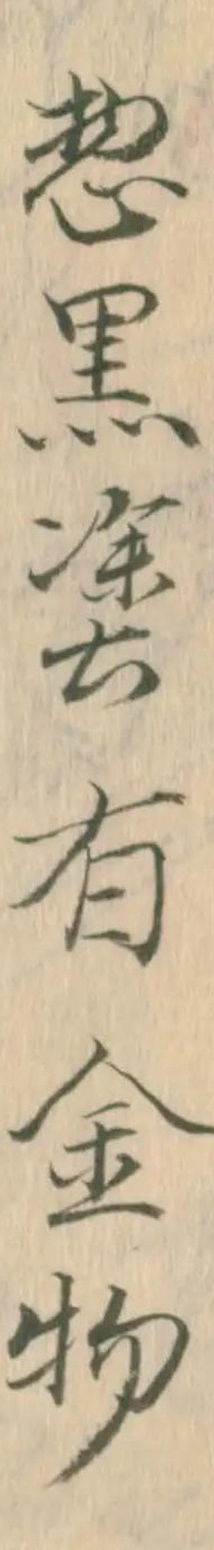惣黒塗有金物
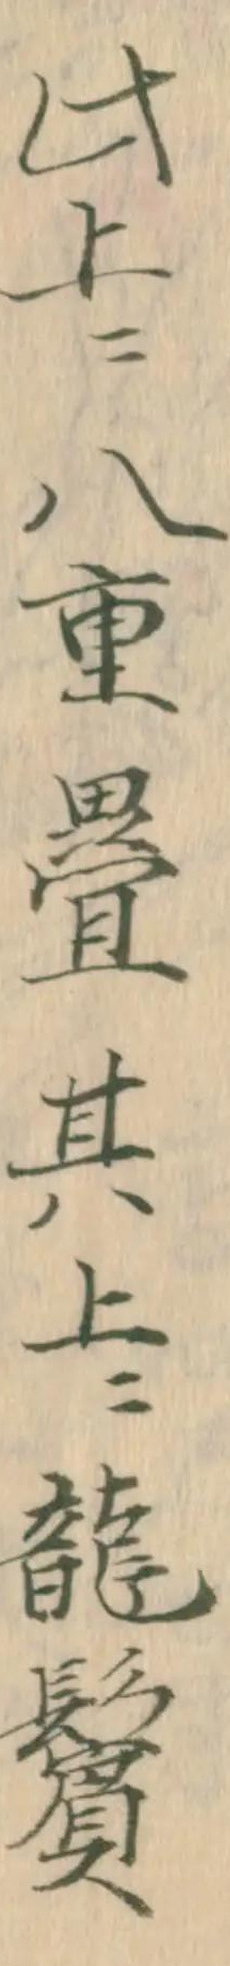此上ニ八重畳其上ニ龍鬢
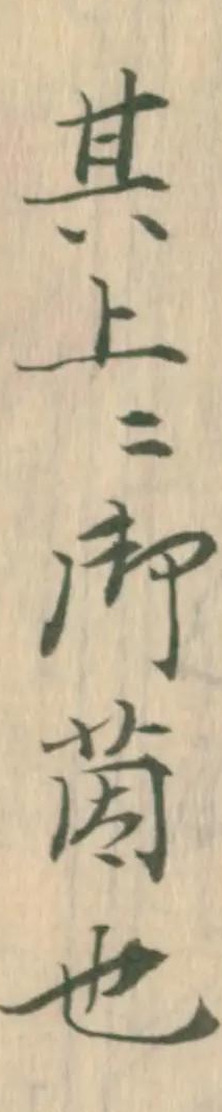其上ニ御茵也
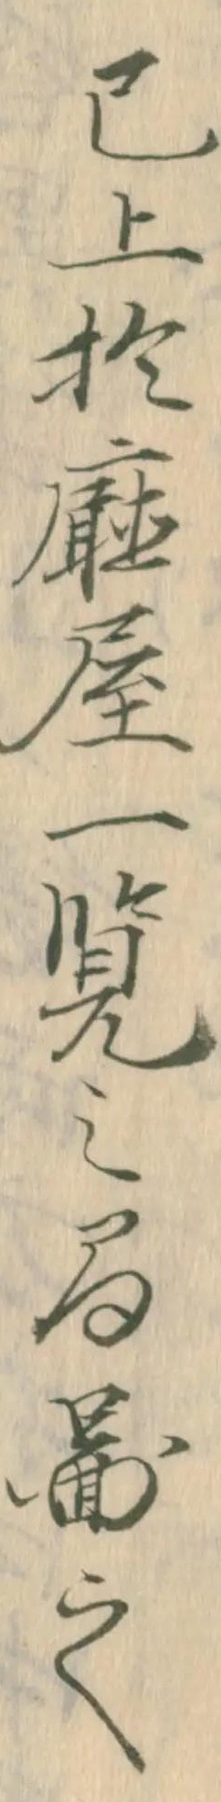已上於庁屋一覧之間図之
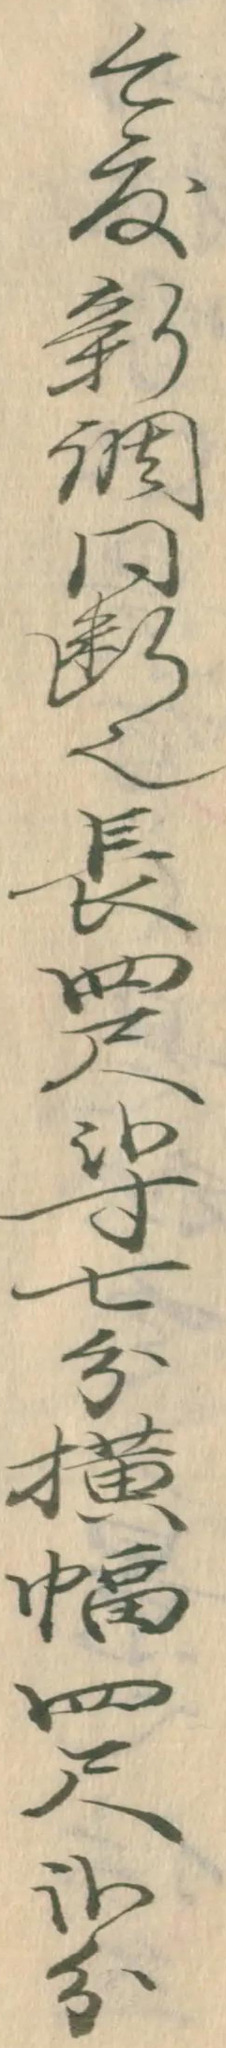今度新調同断也長四尺弐寸七分横幅四尺弐分

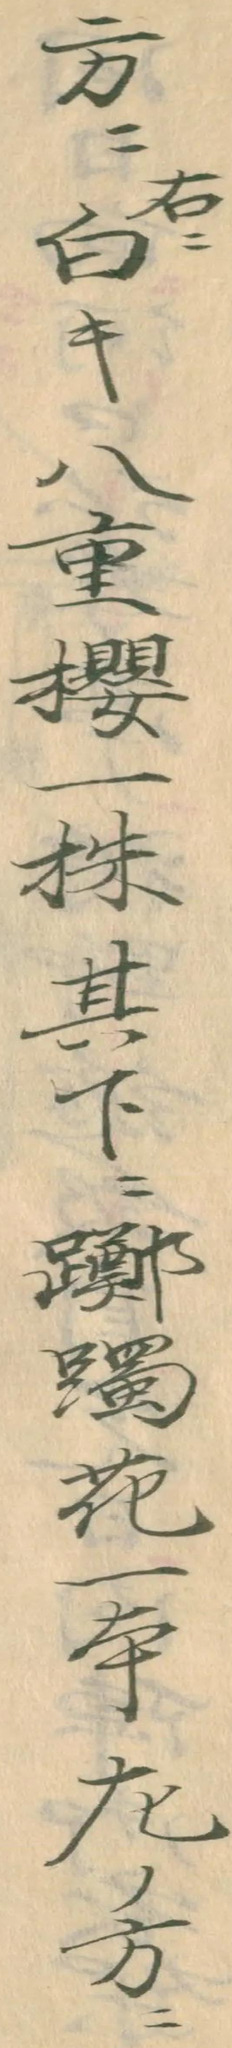方ニ白キ八重桜一株其下ニ躑躅花一本左ノ方ニ
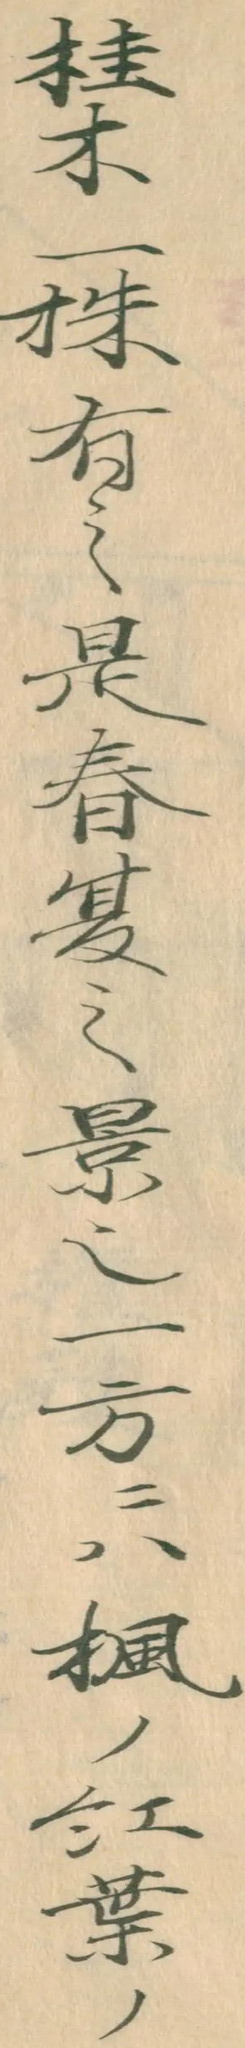桂木一株有之是春夏之景也一方ニハ楓ノ紅葉ノ
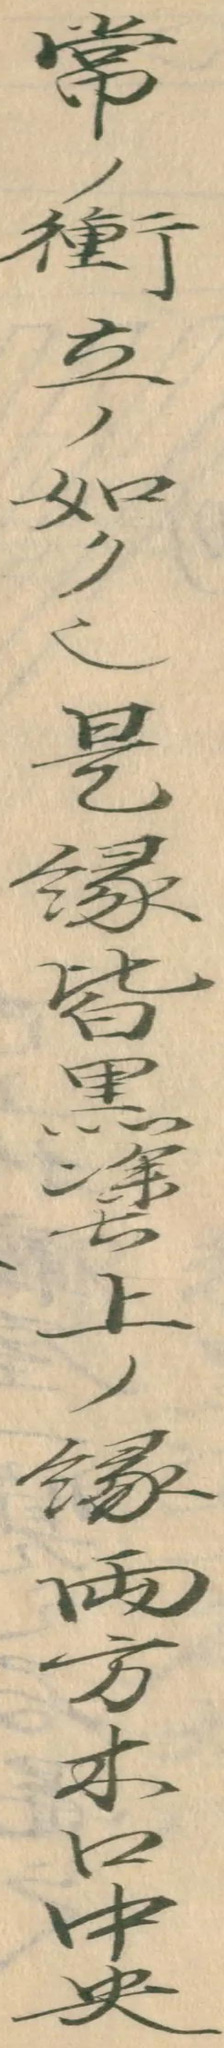常ノ衝立ノ如ク也是縁皆黒塗上ノ縁両方木口中央
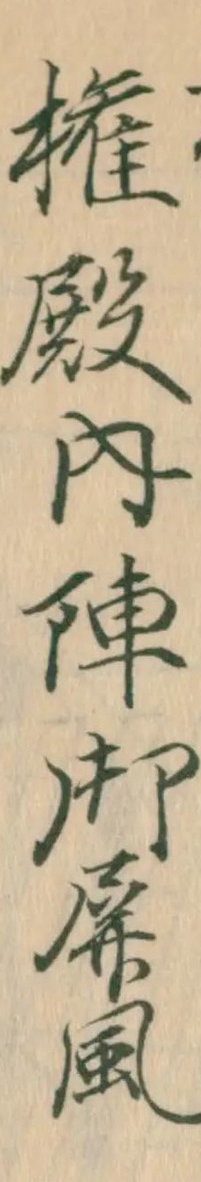権殿内陣御屏風
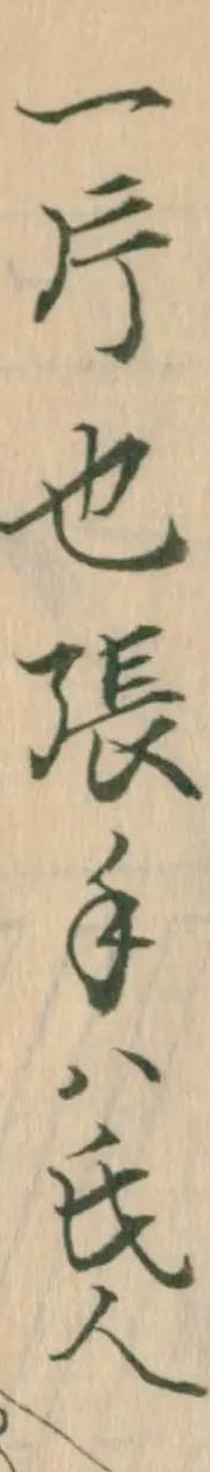一片也張手ハ氏人
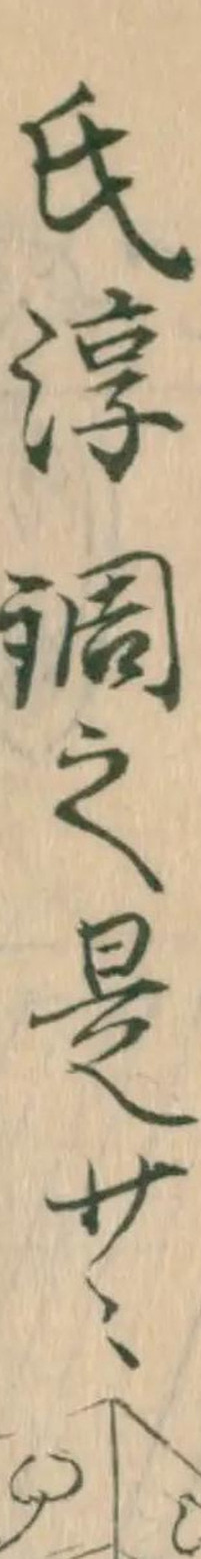氏淳調之是少々
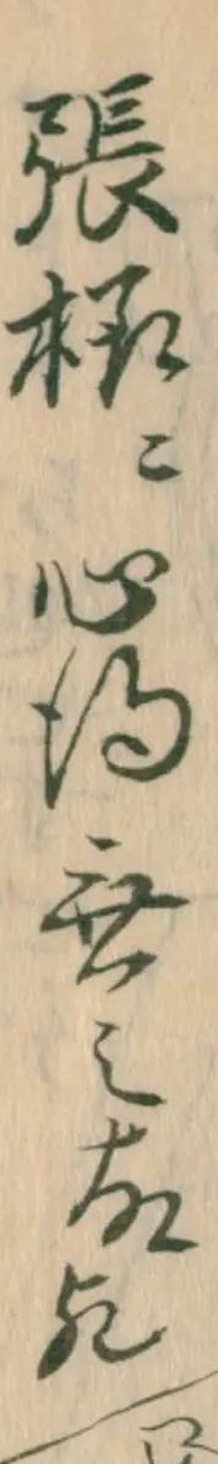張様ニ心得無之故歟
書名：賀茂社記録. 第15冊
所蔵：国立国会図書館 National Diet Library, JAPAN
